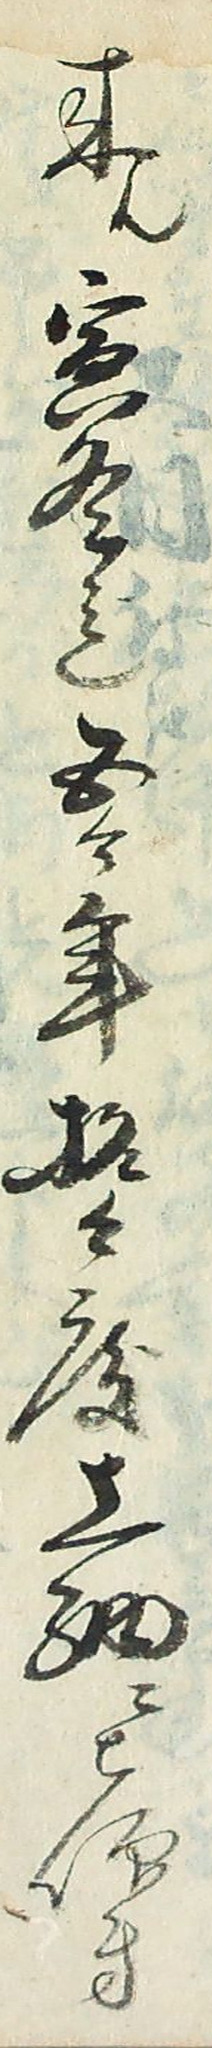来る寅冬迄五ケ年拾ケ度上納に被仰付
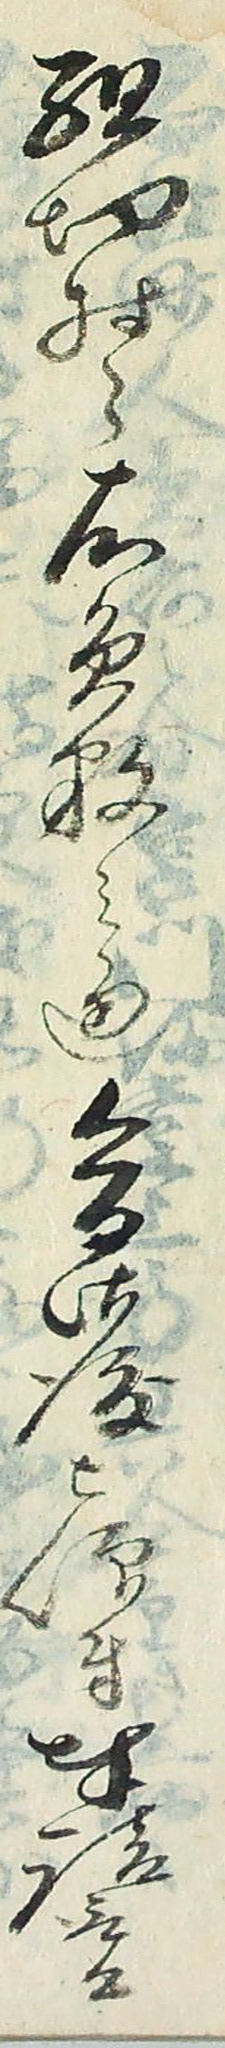組切村々右員数之通今日御渡被仰付奉請取候
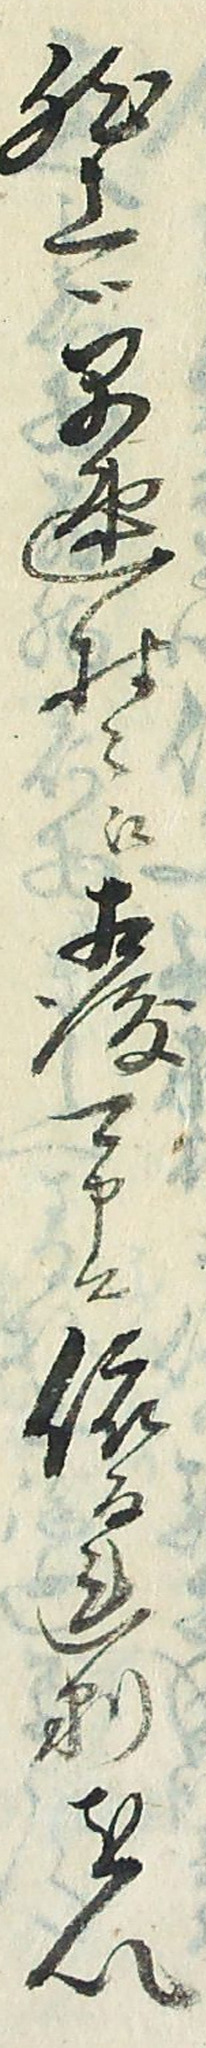然上は早速村々江相渡可申候依而連判を以
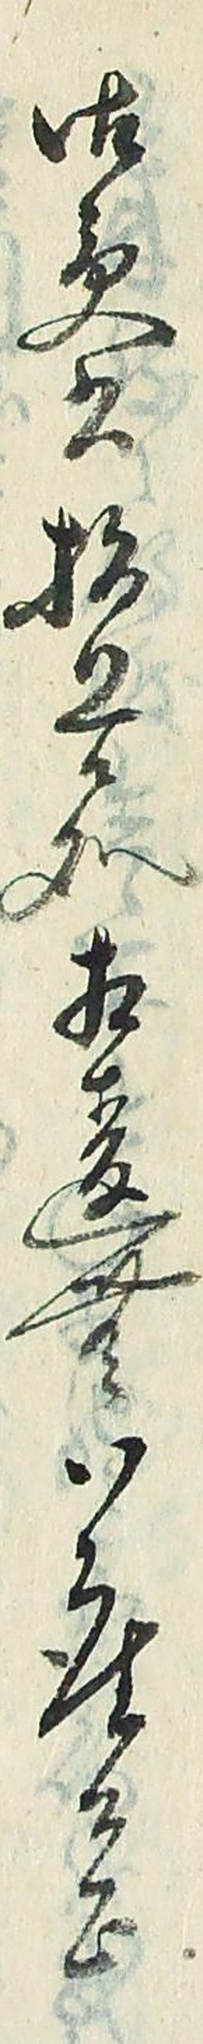御受書指上候所相違無御座候以上
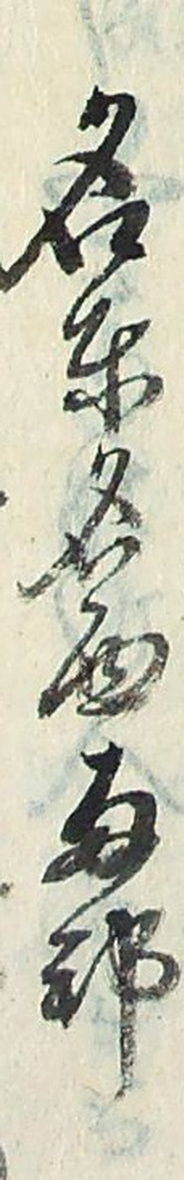名東名西両郡
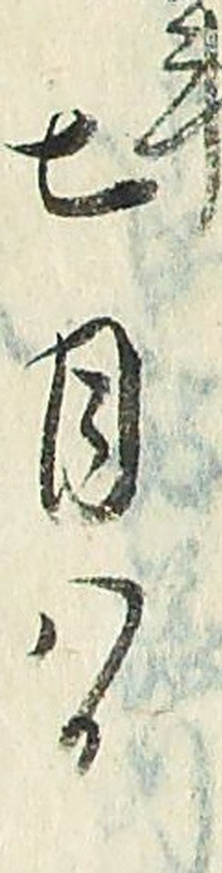七月八日
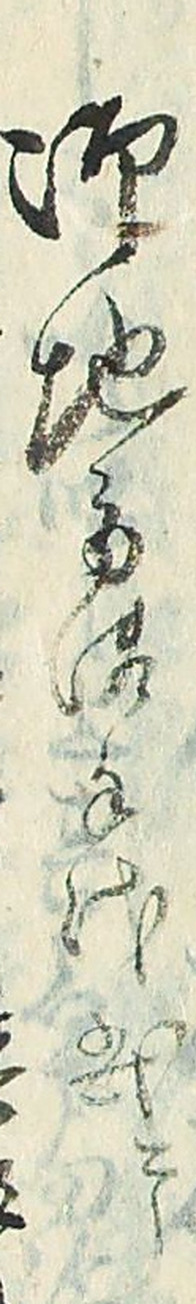御地方御手代当て
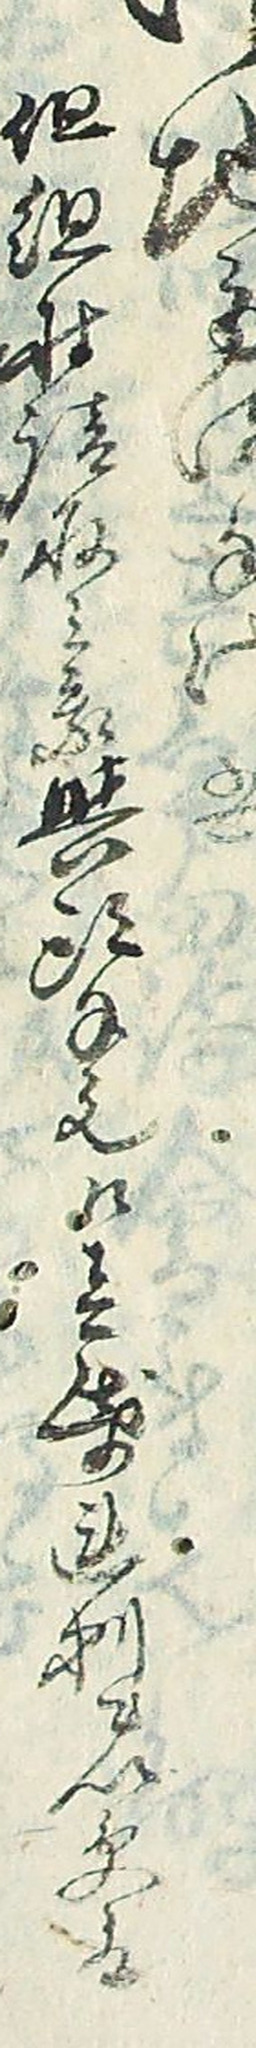但組村請取之義与頭手元へ壱帋連判を以受取
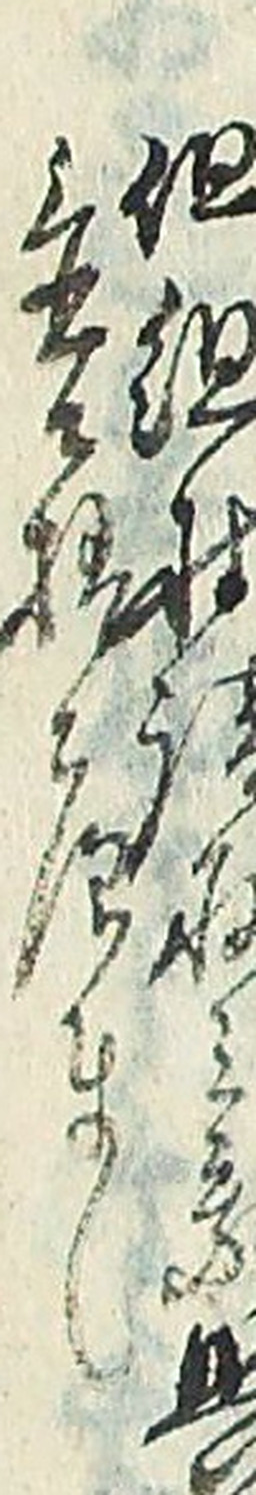置候様被仰付候

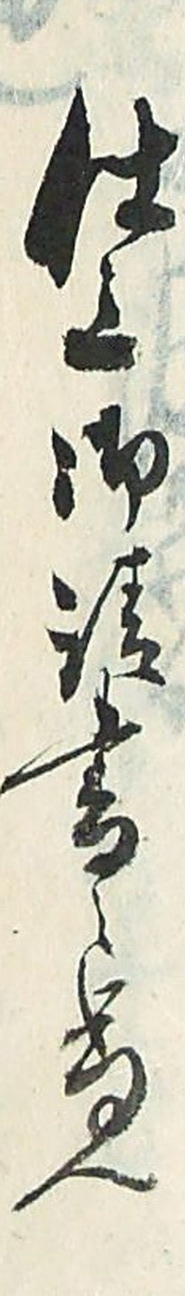仕上御請書之覚
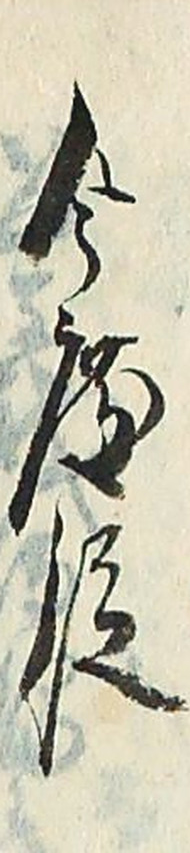今度従
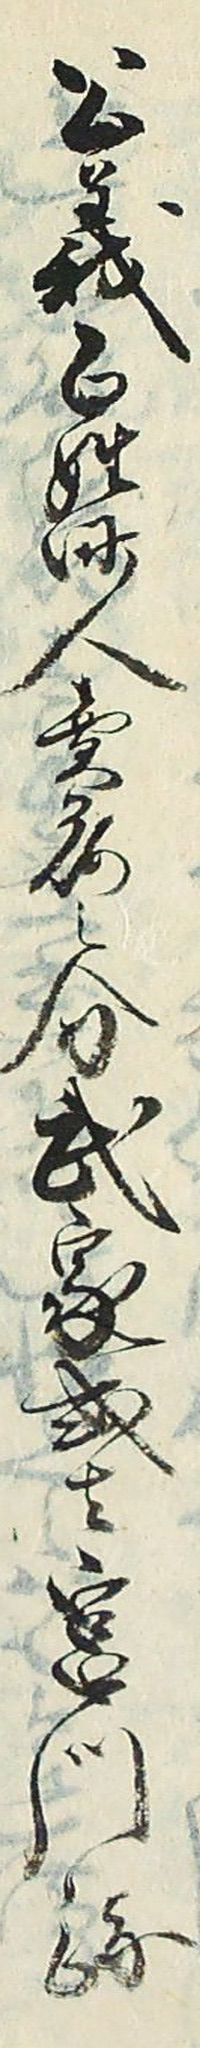公義百姓町人売荷之分武家或は宮門跡
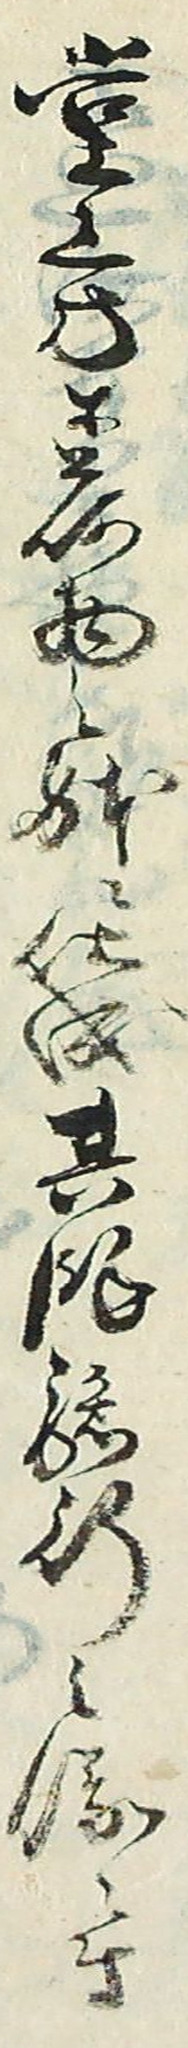堂上方等荷物之体に仕成其余旅行之儀に付
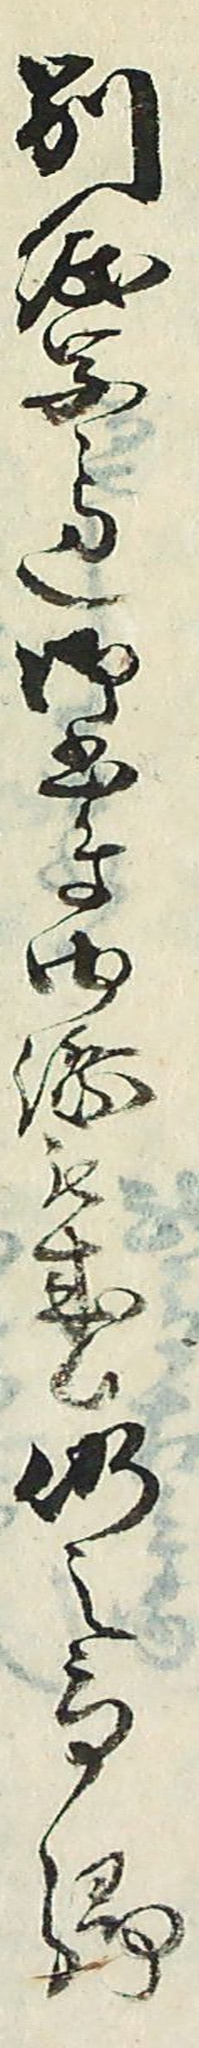別紙写之通御書付御添被成候仍之市郷
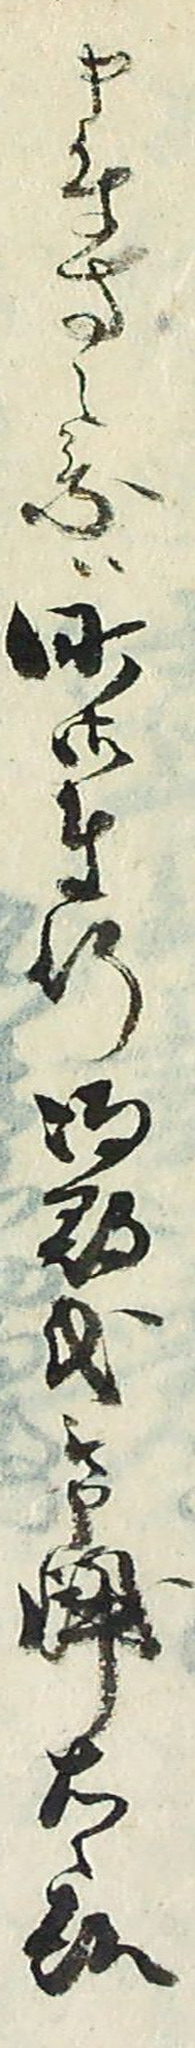申付方之義は町御奉行御郡代被申聞右之趣
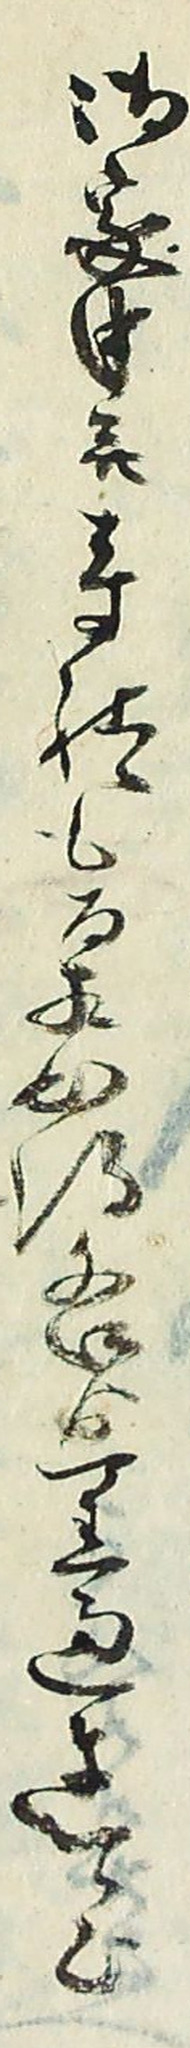御家中幷寺社へも為相心得各ゟ可有通達候
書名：諸御用御□受書控
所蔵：鳴門教育大学 Naruto University of Education
